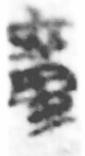𨍱（乘）
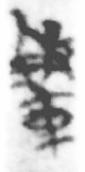○（畋）
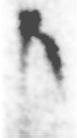人
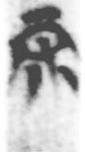兩
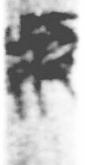與
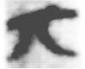亓（其）
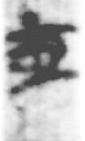車
